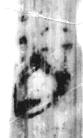丙
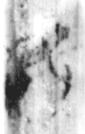戊
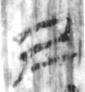己
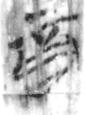啻（帝）
